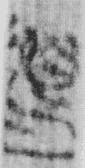道
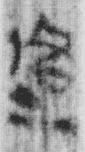○（路）
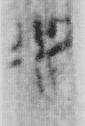母
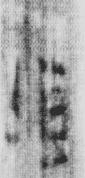愄（畏）
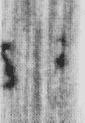母
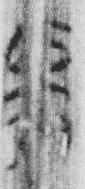蜀（獨）
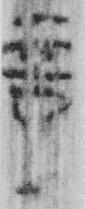言
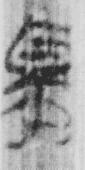蜀（獨）
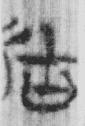居
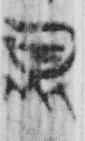鼎（則）
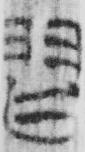習
